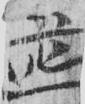武
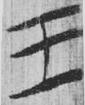王
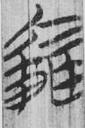{尒䎽}（問）
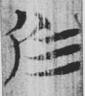於
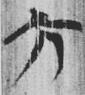大（太）
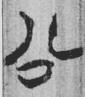公
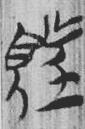○（望）
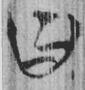曰
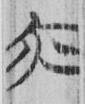亦
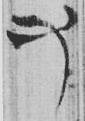又（有）
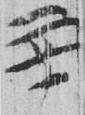不
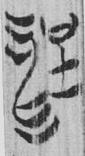浧（盈）
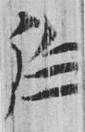於
